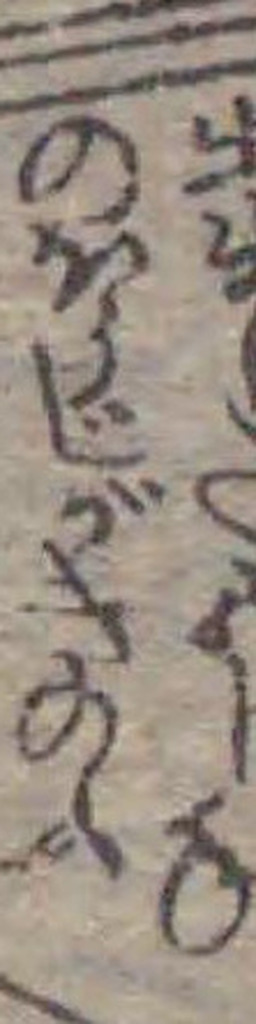のほうじがきのふ
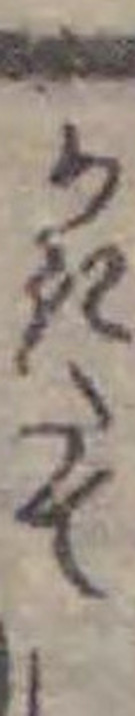かきたて
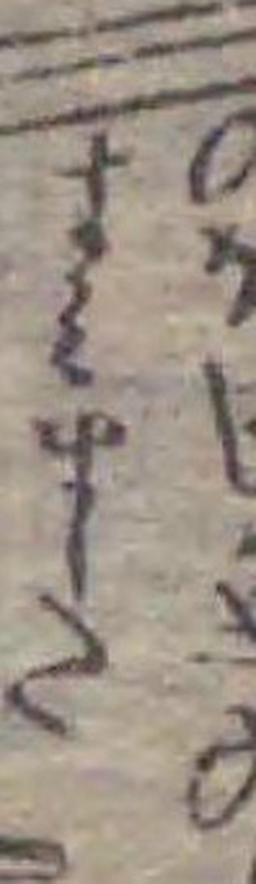すみました
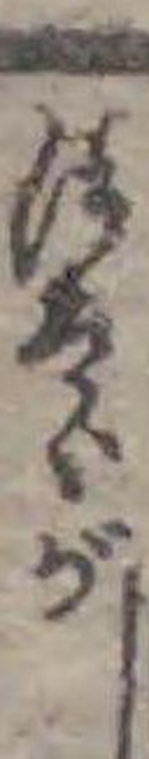清太郎が
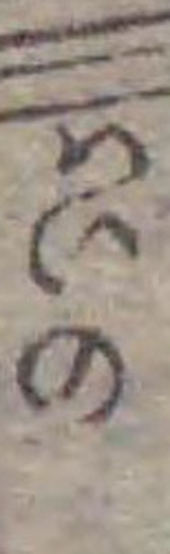わいの
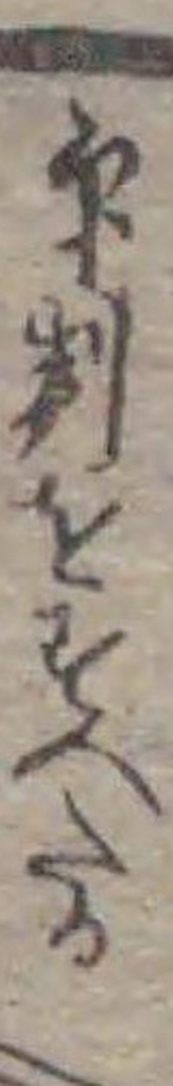印判をすへたる
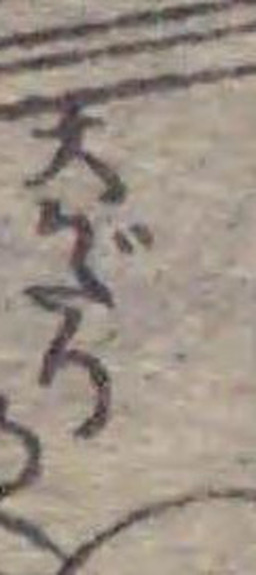大がたりめ
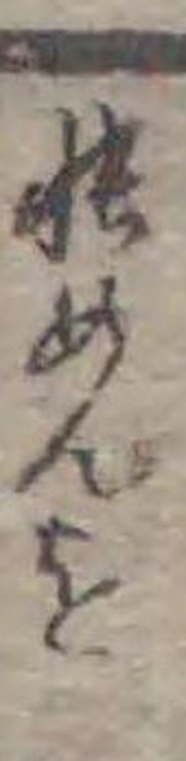帳めんを
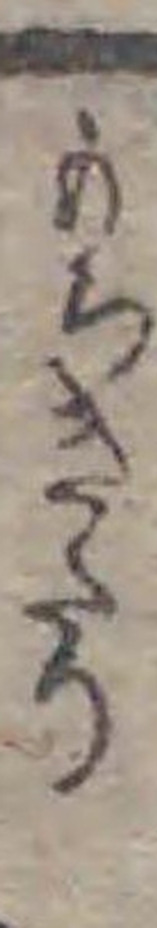もちきたり
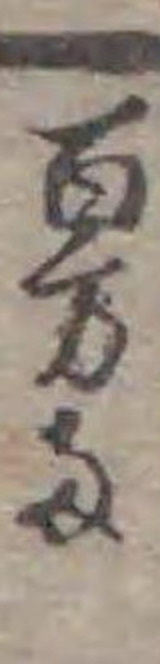百万両
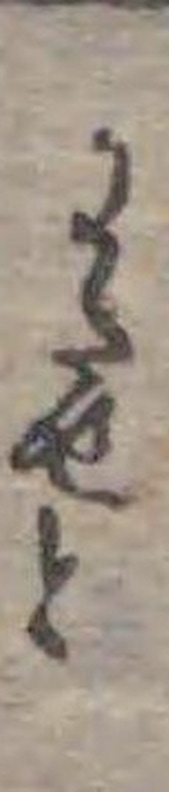わたせと
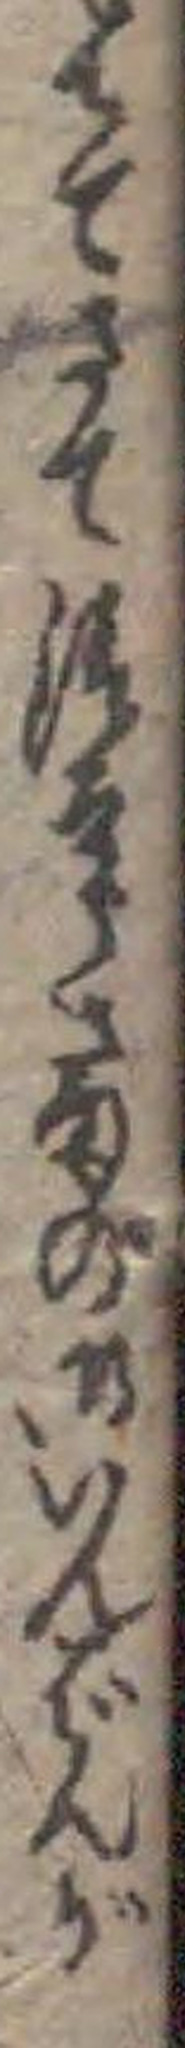はてさて清太郎さまの御いんばんが
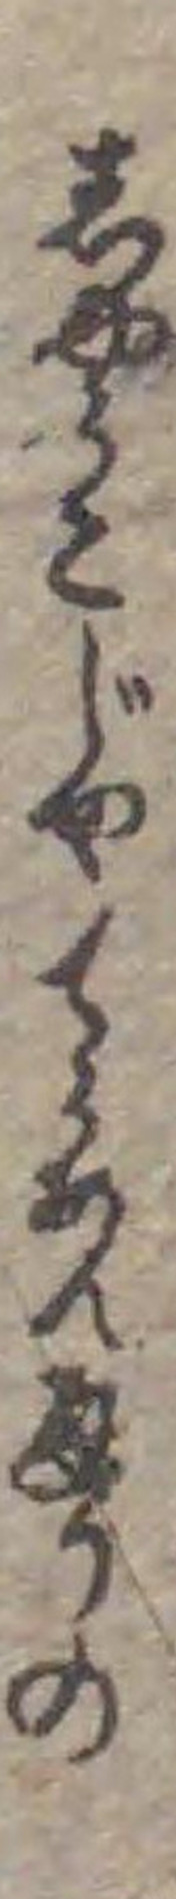しやうこじやてうめん通りの
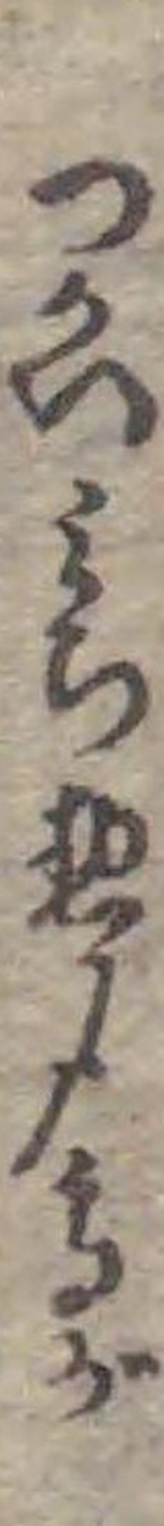つかいみち惣〆高が
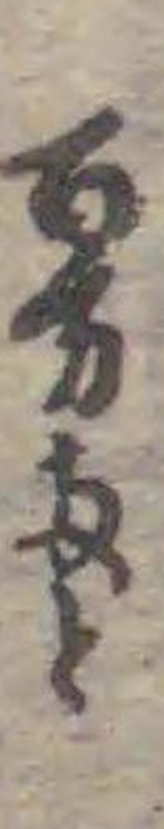百万両と
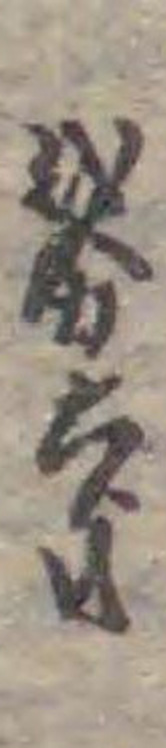弐分六匁
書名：見徳一炊夢 : 3巻
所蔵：国立国会図書館 National Diet Library, JAPAN
